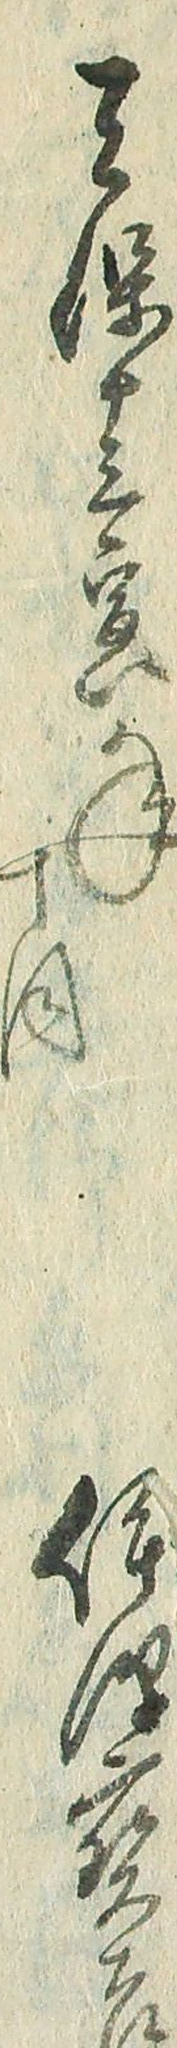天保十三寅年伊澤宝吉

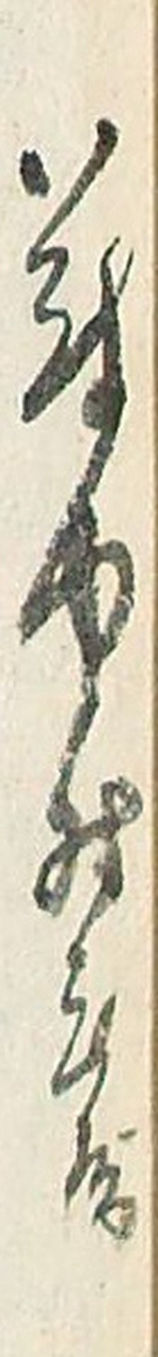府中村庄屋
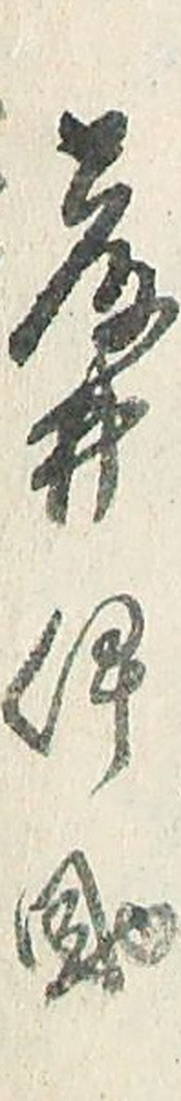藤井伊助
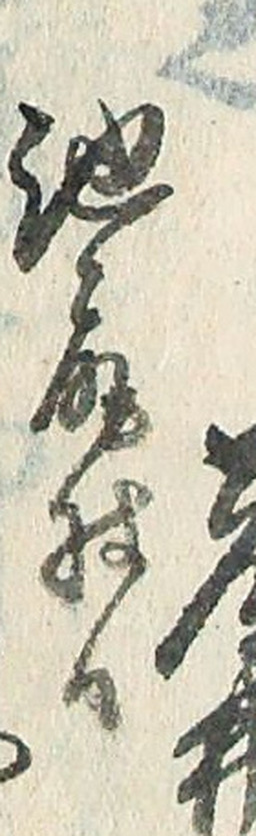池尻村同
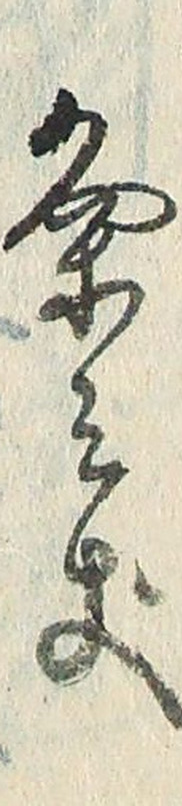粂之丈
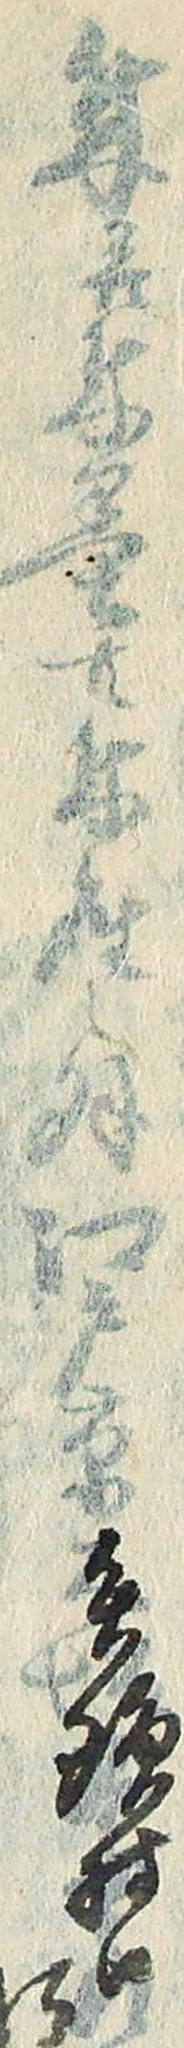矢野村同
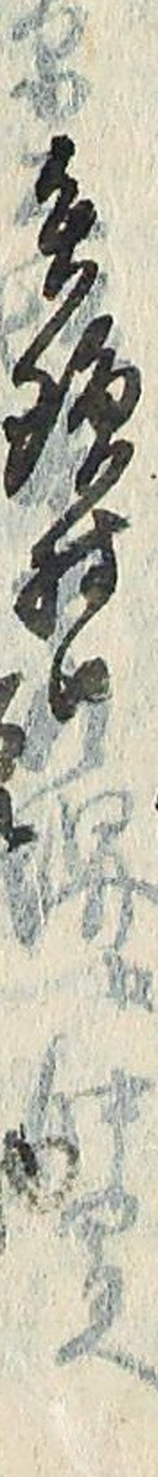矢野村同
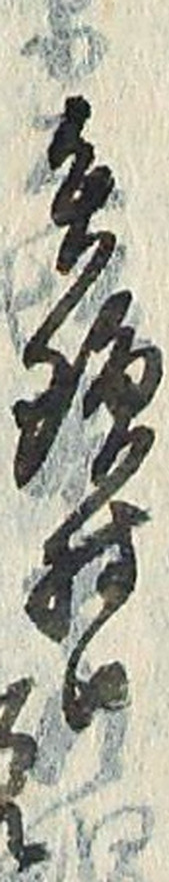矢野村同
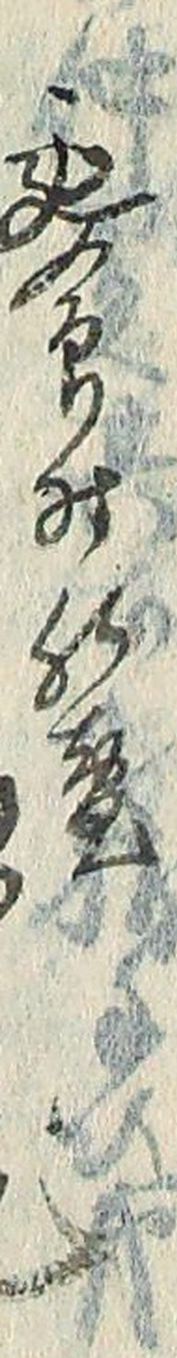延命村肝煎
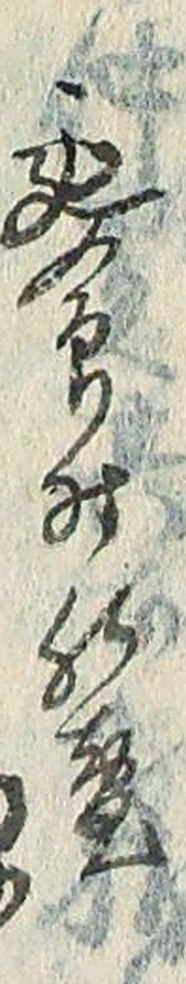延命村肝煎
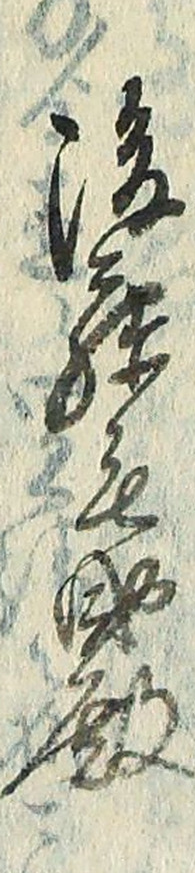後藤庄助殿
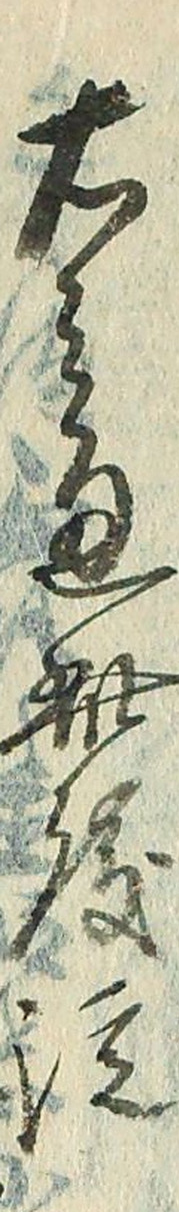右之通此度従
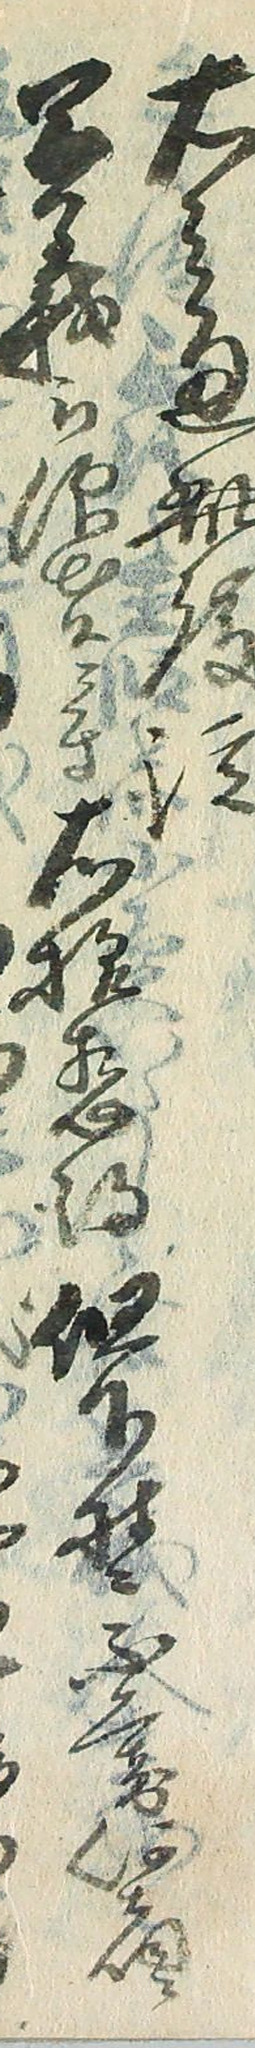公義被仰出候に付右様相心得組下村々不寄
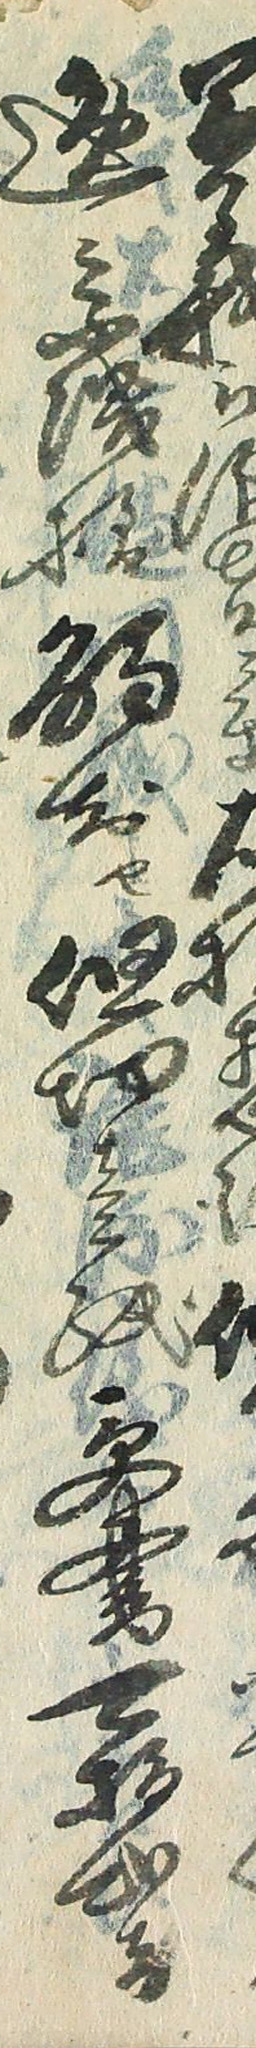逸々不洩様触知せ組切壱紙受書可指出旨
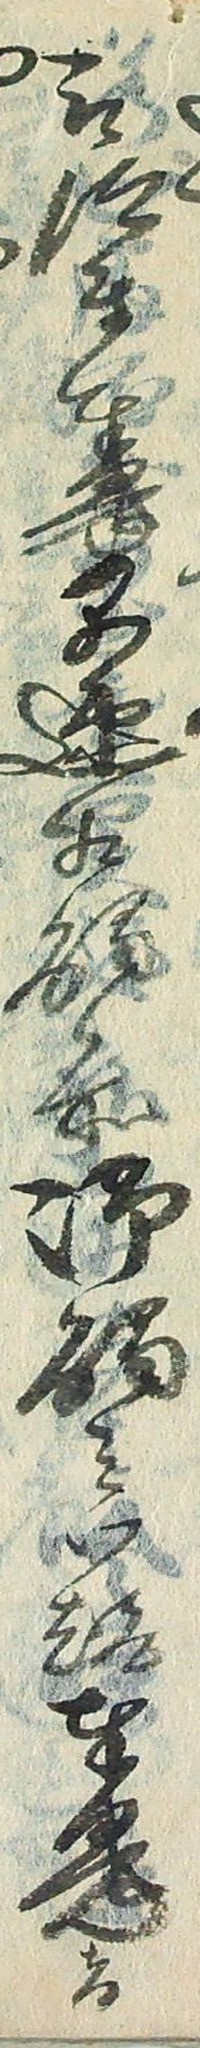被仰付奉畏早速相触候所御触之御趣奉畏旨
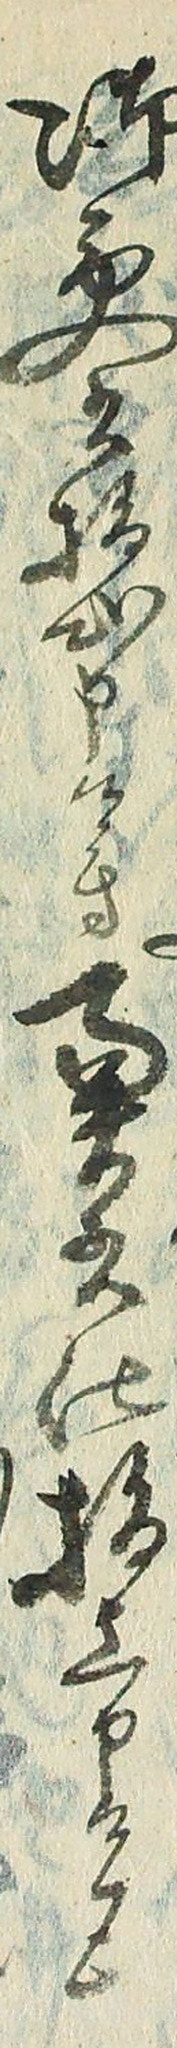御受書指上申候に付奥書仕指上申候以上
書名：諸御用御□受書控
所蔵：鳴門教育大学 Naruto University of Education
